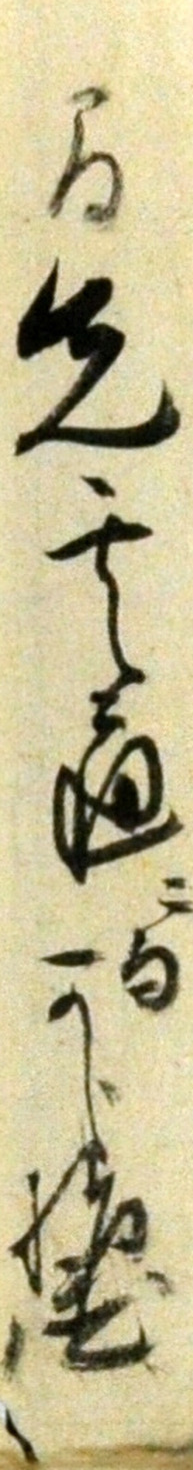間先其通に而可指置候
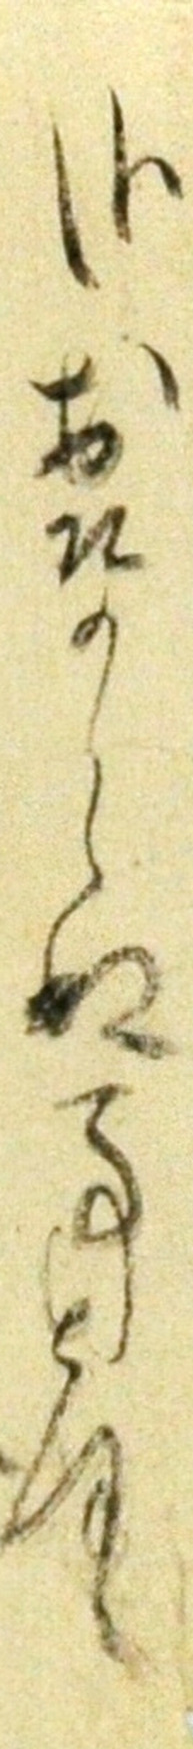哉おそからぬ事と存候
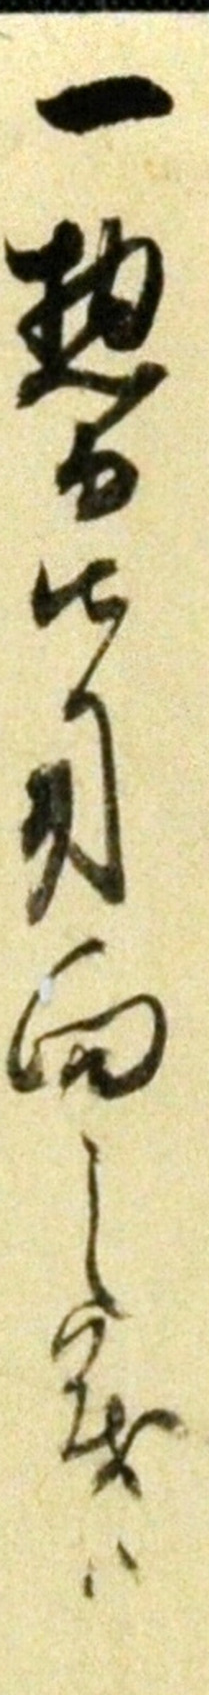一惣而御用向之儀は
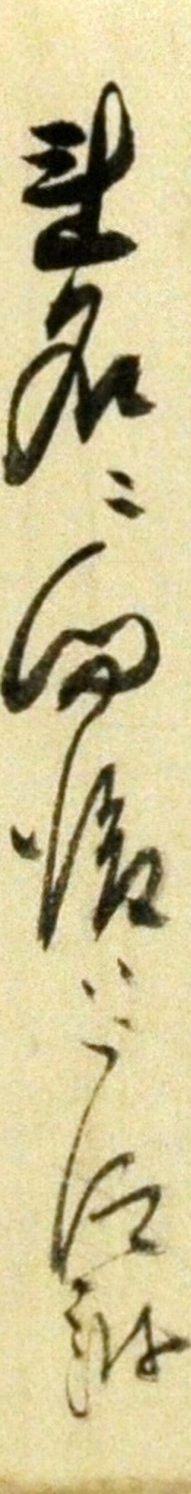連名に向後は被仰越
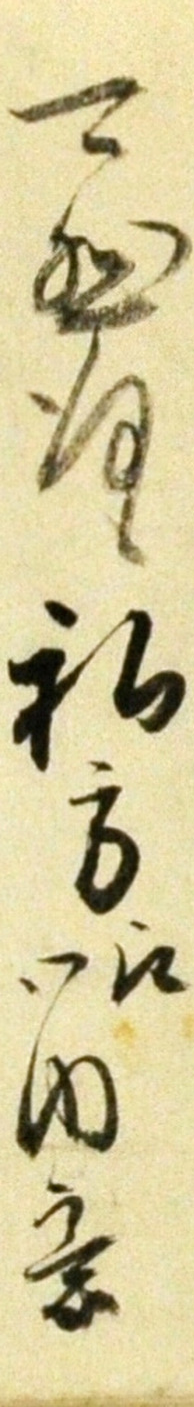可然存候私方江御内意
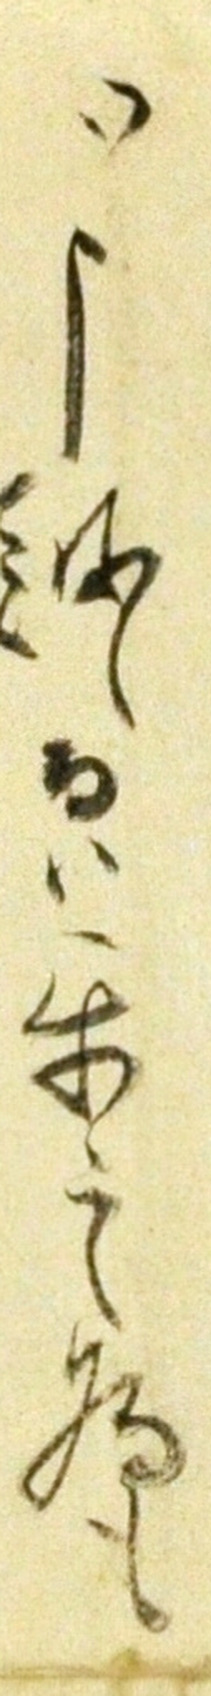御申越候而は互之為も
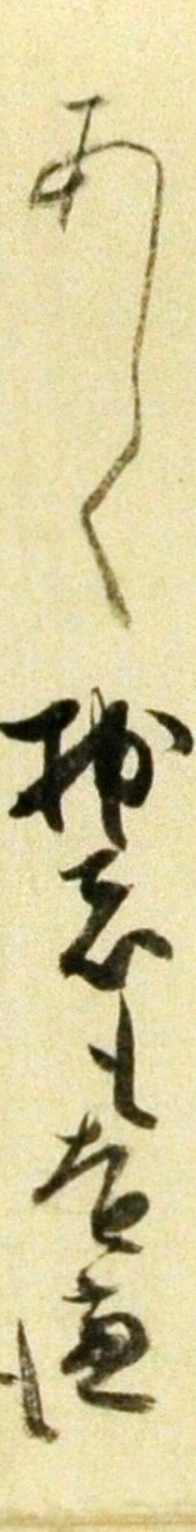あしく拙者も遠慮も
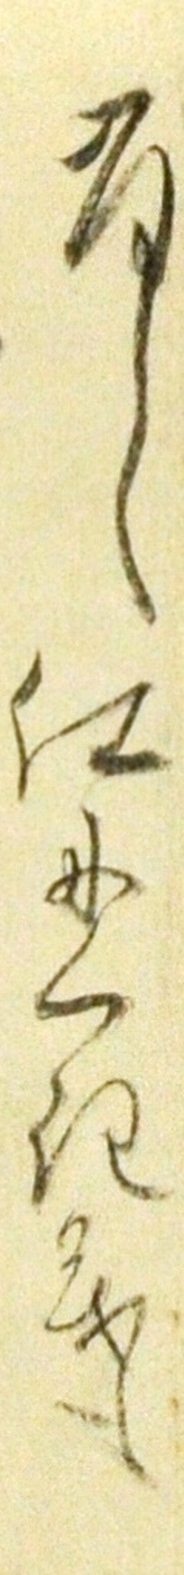有之仕にくき儀も
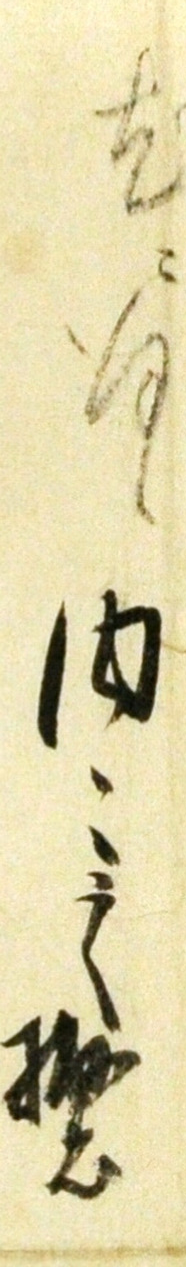尤に存候内々之拙者
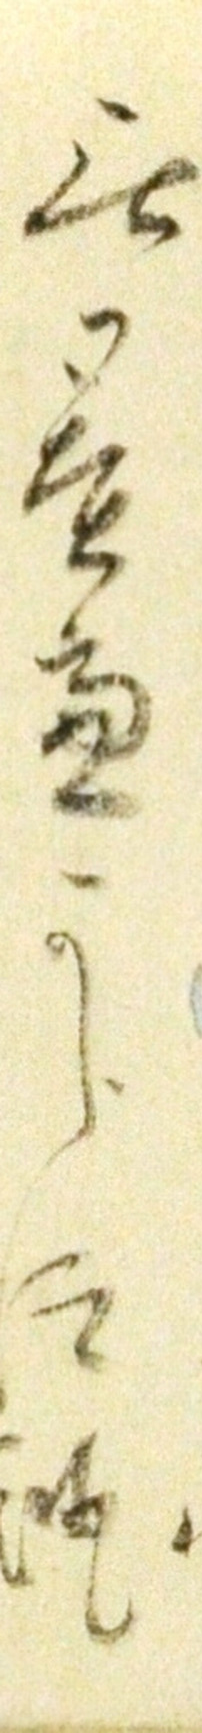無御遠慮可被仰越候
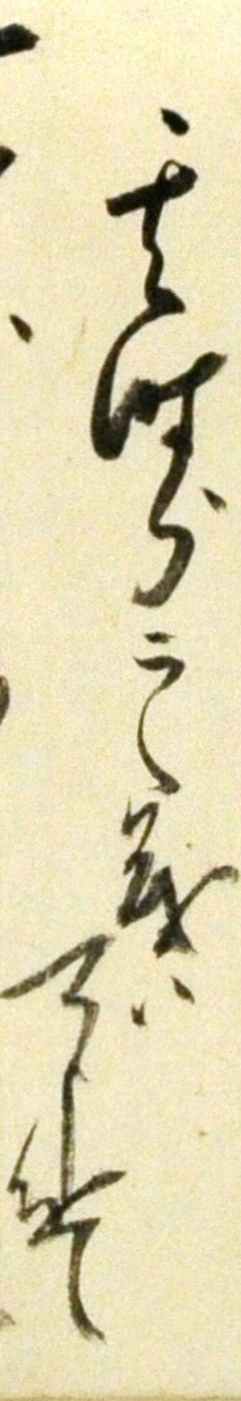其時分之儀は可申進候
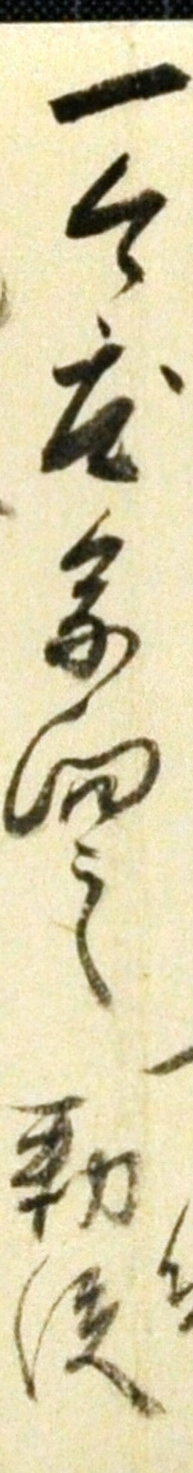一今度参向之勅使
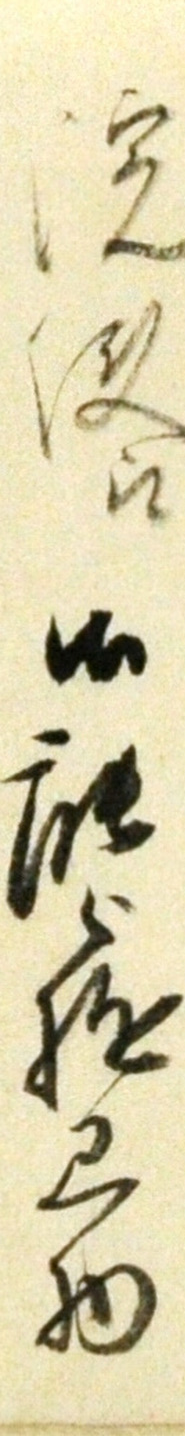院使江御能被遊見物
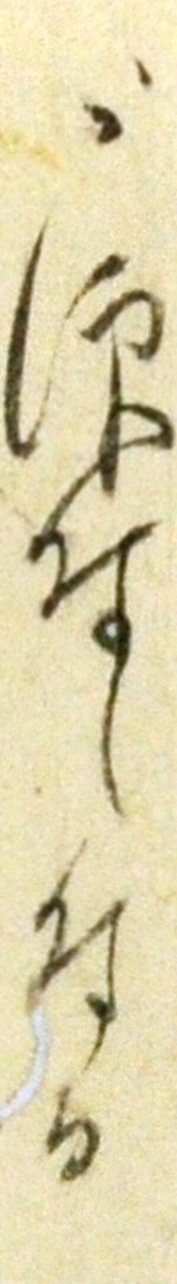被仰付候付而
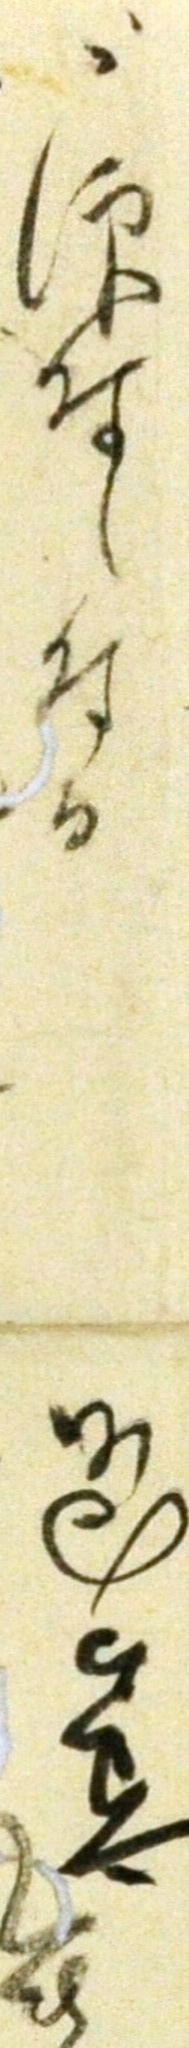被仰付候付而
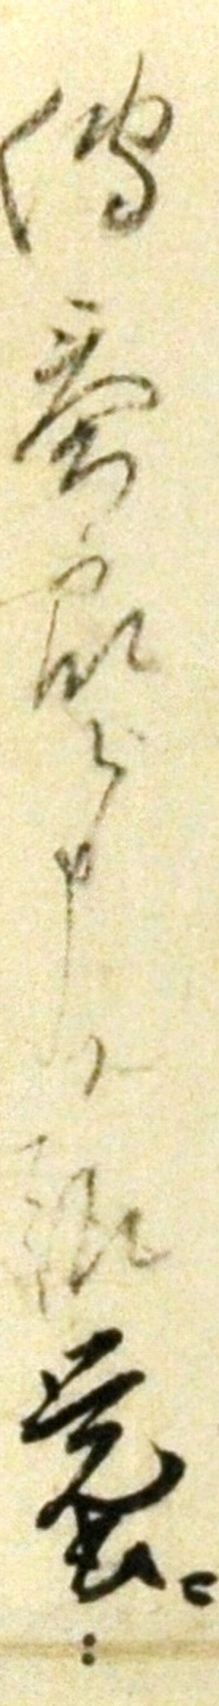伝奏衆被申候趣覚書に
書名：書状
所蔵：伊那市立高遠町図書館・合同会社AMANE
